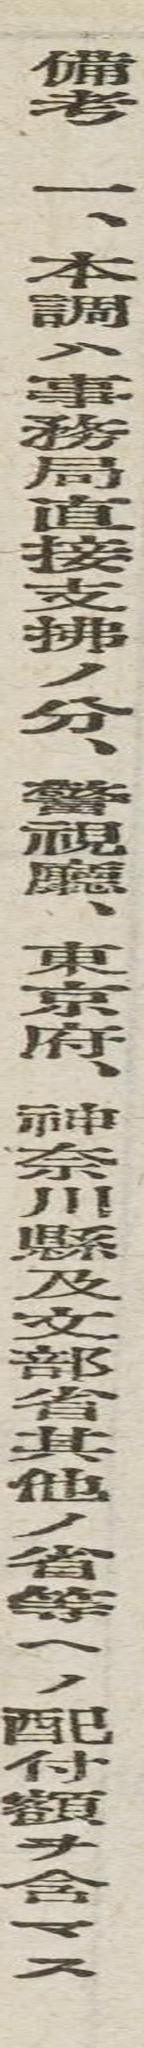備考一、本調ハ事務局直接支払ノ分、警視庁、東京府、神奈川県及文部省其他ノ省等ヘノ配布額ヲ含マス
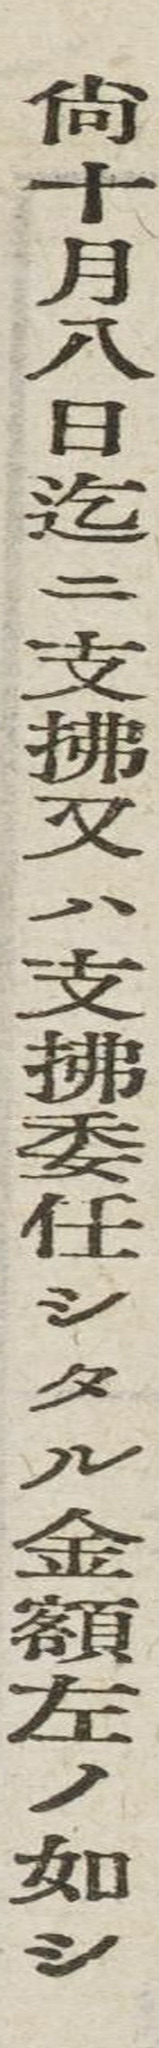尚十月八日迄ニ支払又ハ支払委任シタル金額左ノ如シ

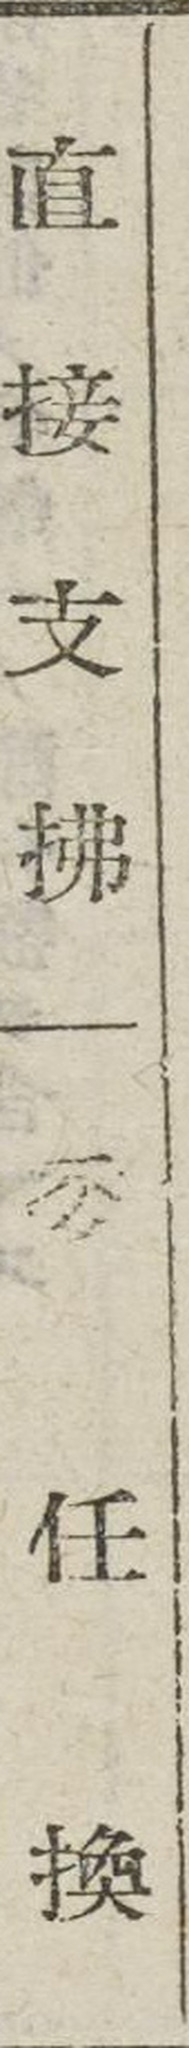直接支払委任換

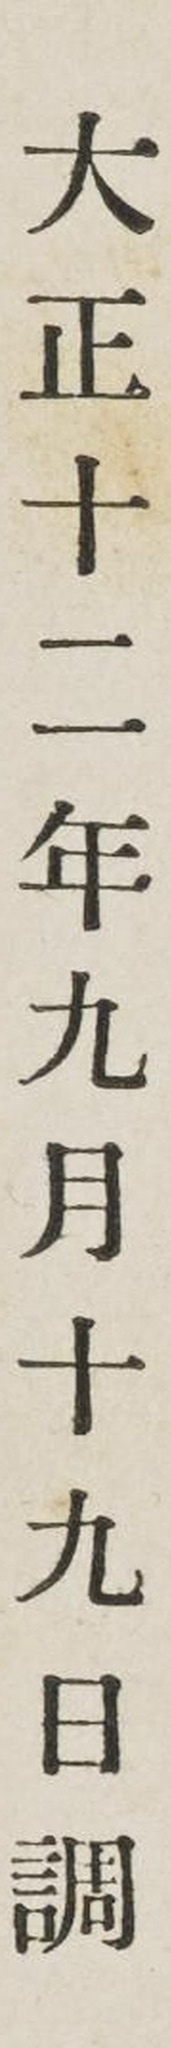大正十二年九月十九日調
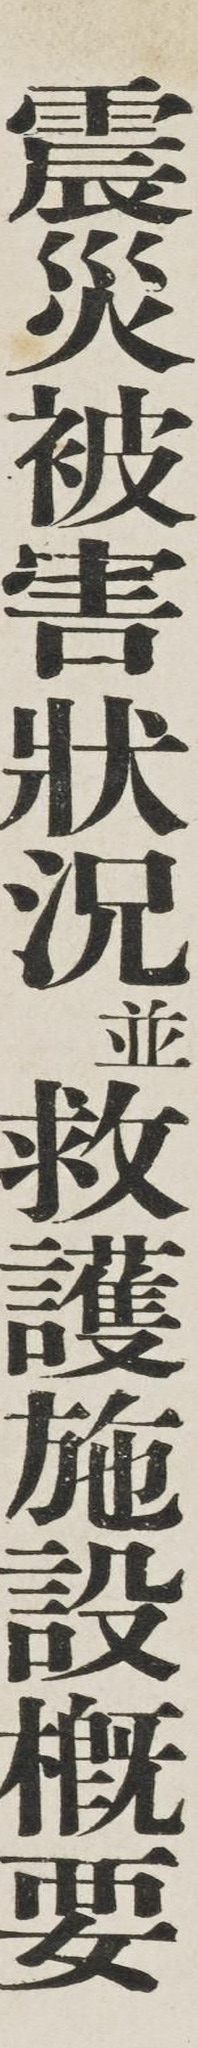震災被害状況並救護施設概要
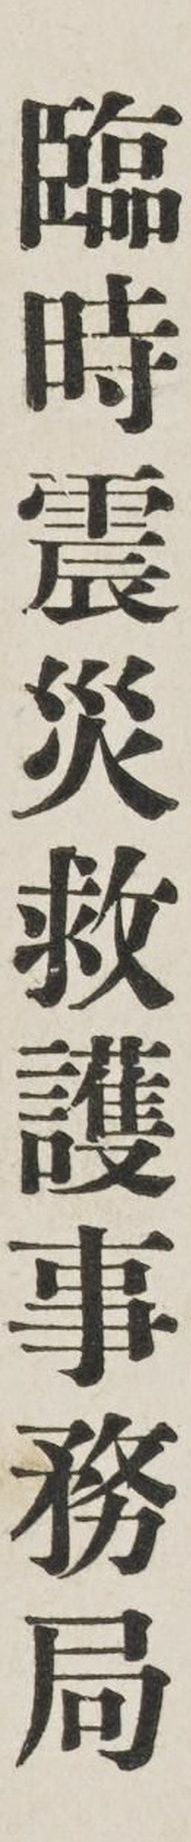臨時震災救護事務局

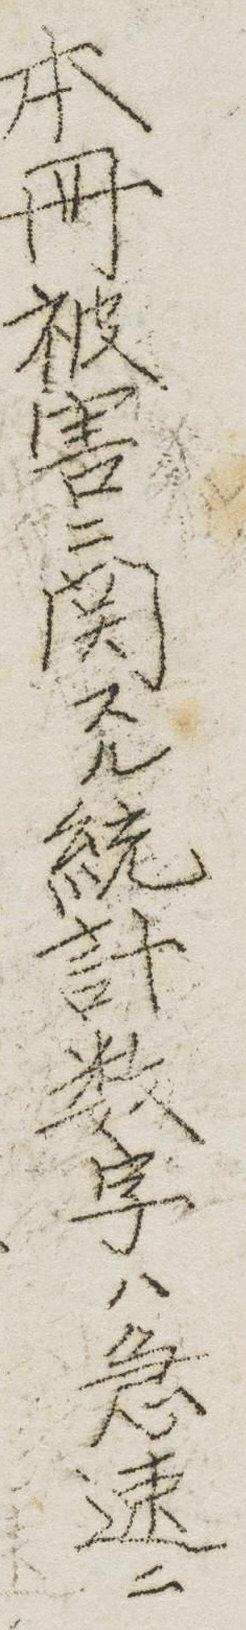本冊被害ニ関スル統計数字ハ急速ニ
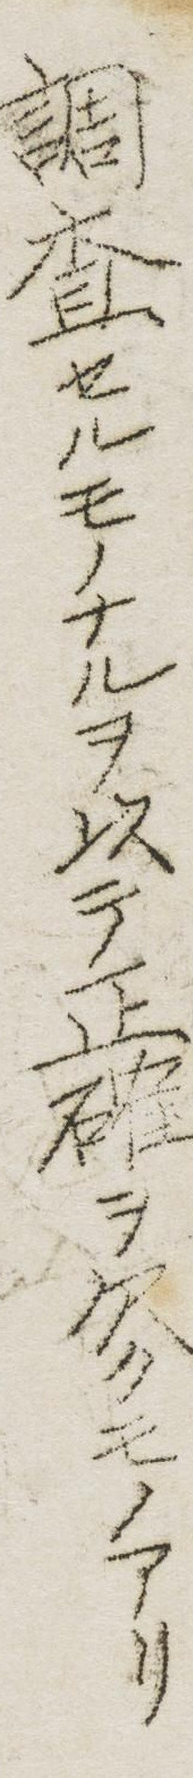調査セルモノナルヲ以テ正確ヲ欠クモノアリ
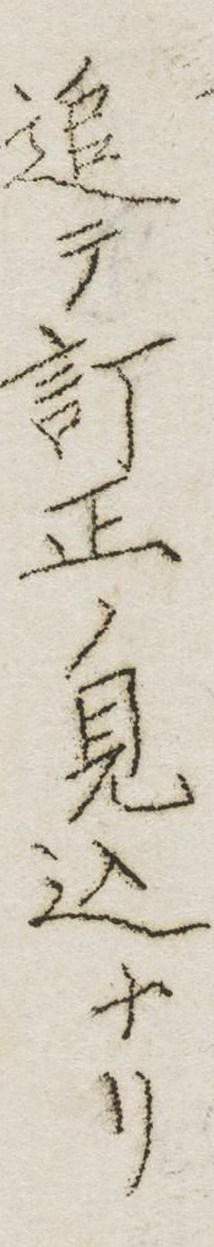追テ訂正ノ見込ナリ
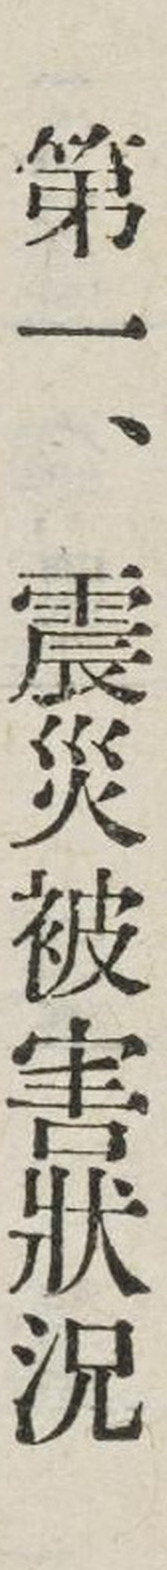第一、震災被害状況
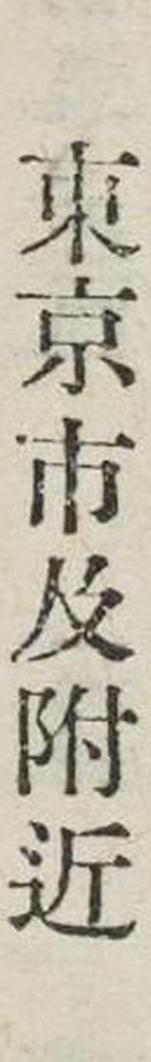１東京市及付近
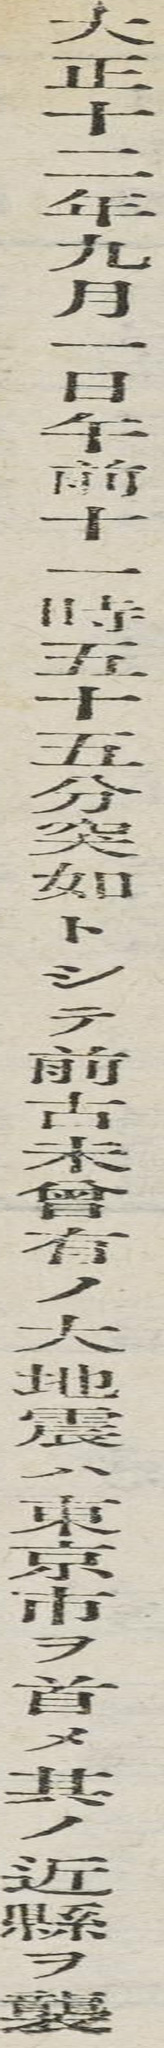大正十二年九月一日午前十一時五十五分突如トシテ前古未曽有ノ大地震ハ東京市ヲ首メ其ノ近県ヲ襲
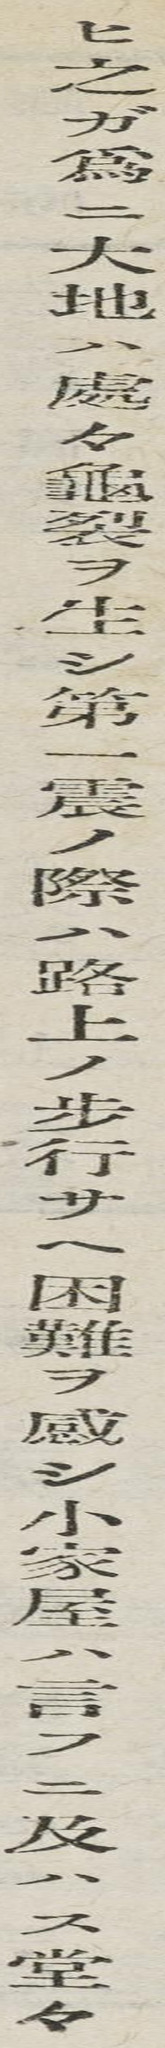ヒ之ガ為ニ大地ハ処々亀裂ヲ生シ第一震ノ際ハ路上ノ歩行サヘ困難ヲ感シ小家屋ハ言フニ及ハス堂々
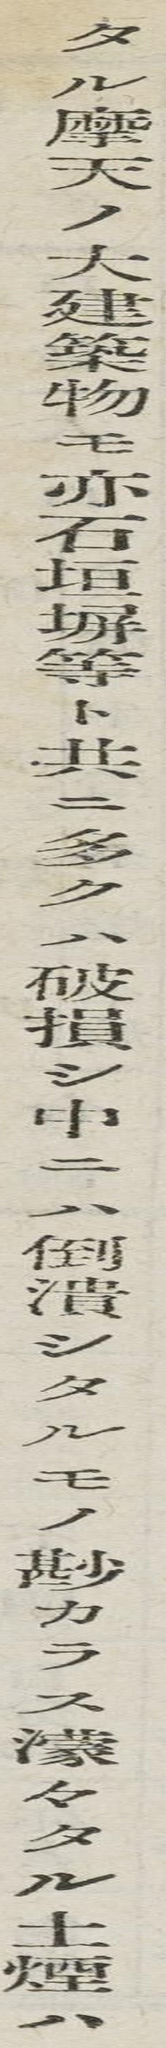タル摩天ノ大建築物モ亦石垣塀等ト共ニ多クハ破損シ中ニハ倒潰シタルモノ尠カラス濛々タル土煙ハ
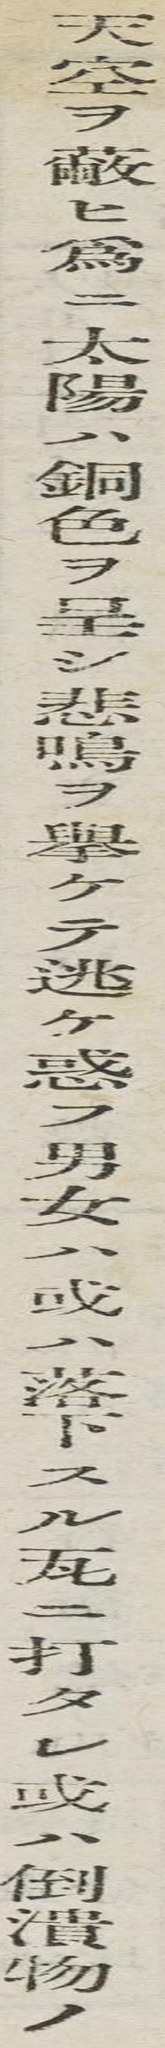天空ヲ蔽ヒ為ニ太陽ハ銅色ヲ呈シ悲鳴ヲ挙ケテ逃ケ惑フ男女ハ或ハ落下スル瓦ニ打タレ或ハ倒潰物ノ
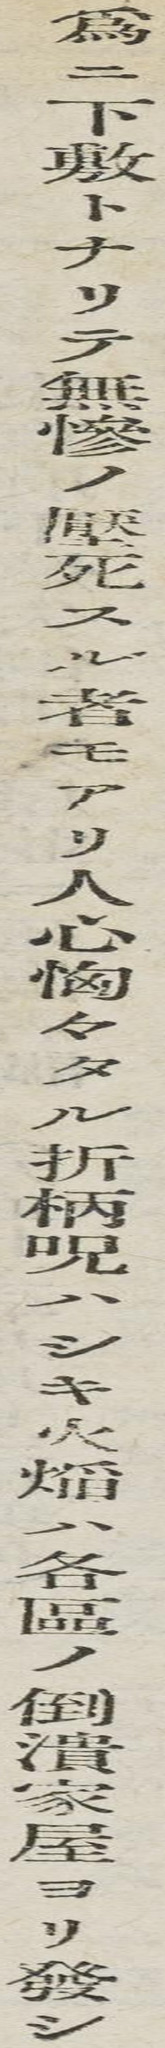為ニ下敷トナリテ無惨ノ圧死スル者モアリ人心恟々タル折柄呪ハシキ火焔ハ各区ノ倒潰家屋ヨリ発シ
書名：震災被害状況並救護施設概要
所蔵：東京大学地震研究所図書室 Earthquake Research Institute Library, The University of Tokyo, JAPAN
